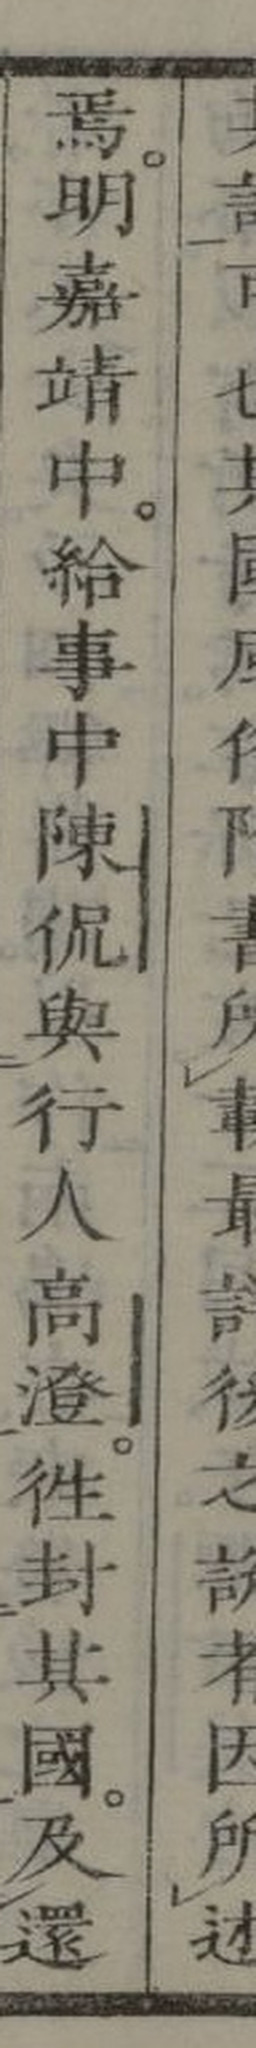焉。明嘉靖中。給事中陳侃與行人高澄。徃封其國。及還

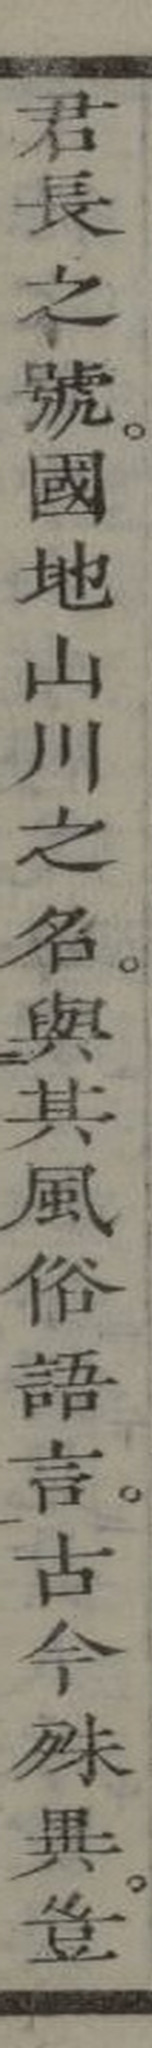君長之號。國地山川之名。與其風俗語言。古今殊異。豈
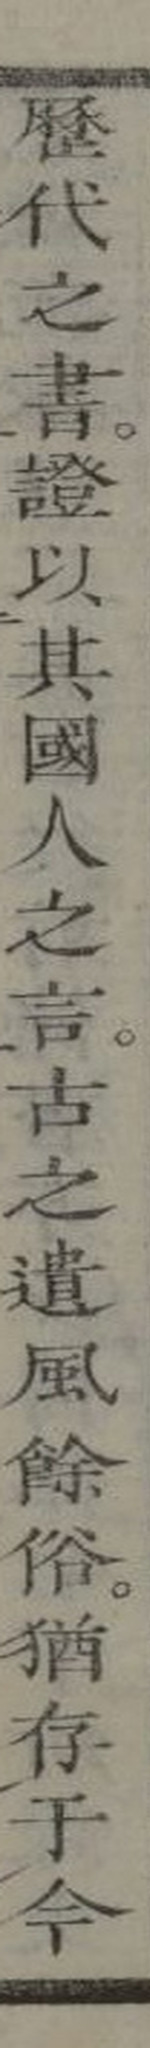歷代之書。證以其國人之言。古之遺風餘俗。猶存于今
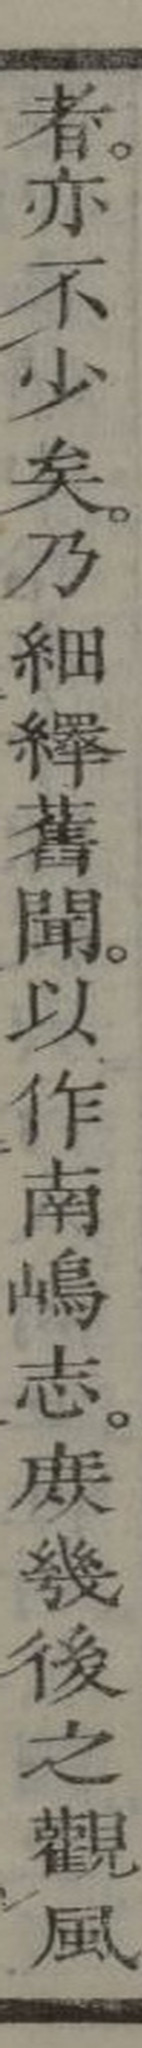者。亦不少矣。乃細繹舊聞。以作南嶋志。庻幾後之觀風
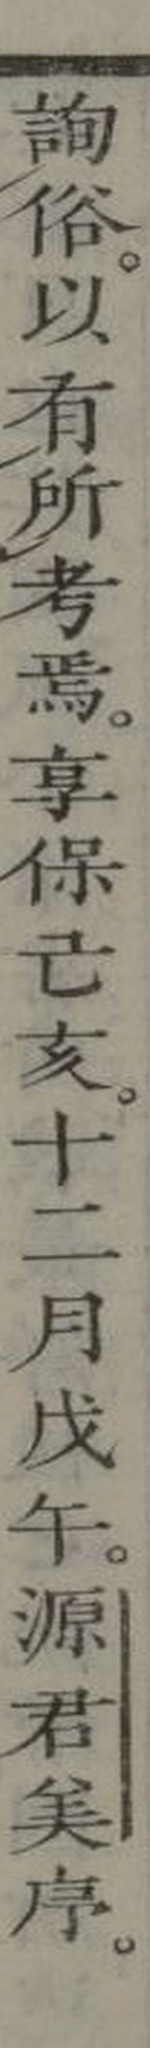詢俗。以有所考焉。享保己亥。十二月戊午。源君美序。
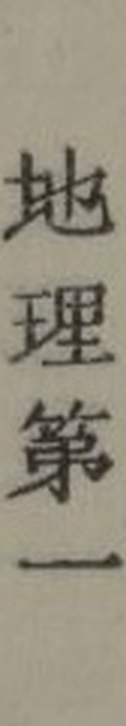地理第一
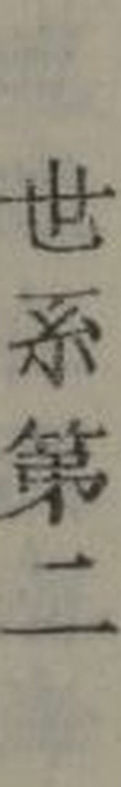世系第二
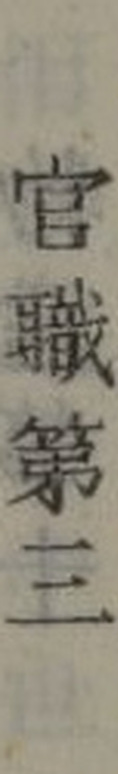官職第三
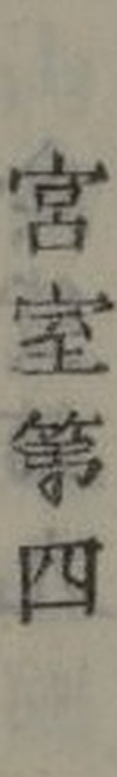宮室第四
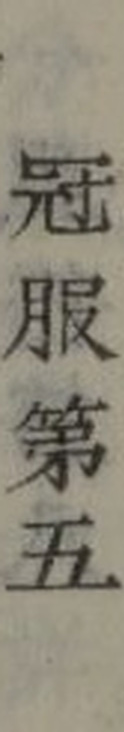冠服第五
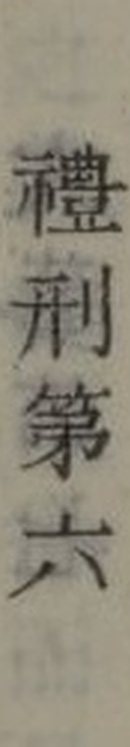禮刑第六
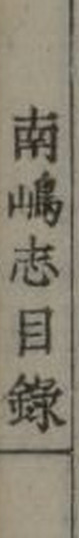南嶋志目錄

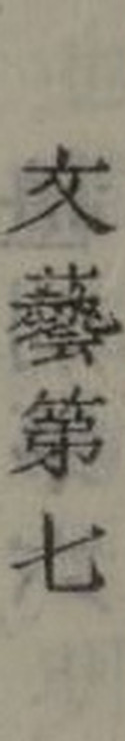文藝第七
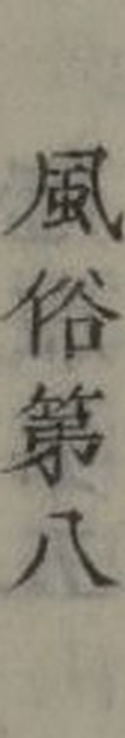風俗第八
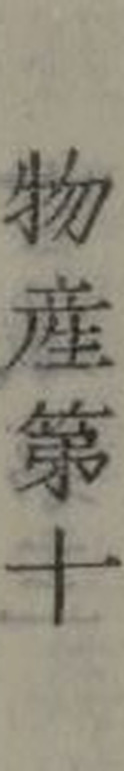物産第十
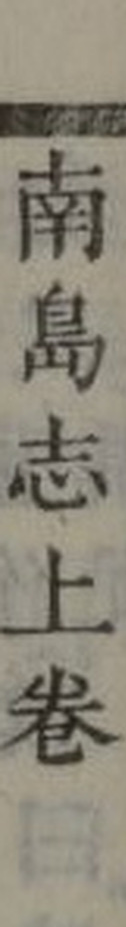南島志上卷
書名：南島志 呂
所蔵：University of the Ryukyus Library
